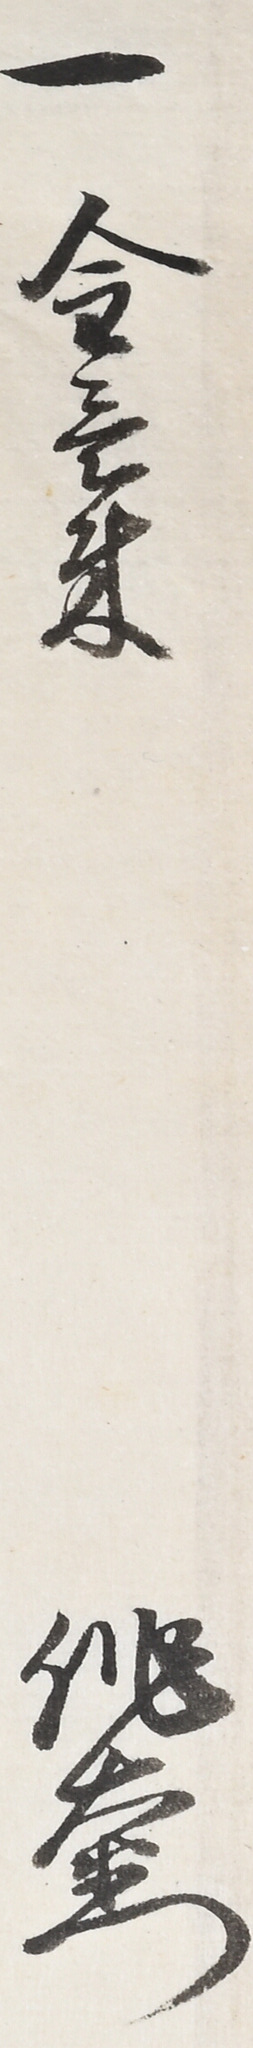一金壱朱作右衛門
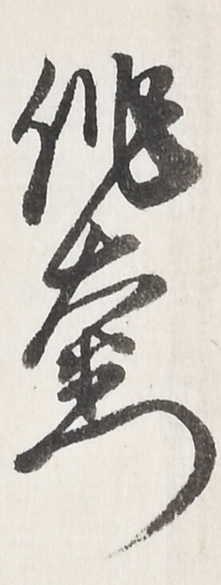嘉右衛門
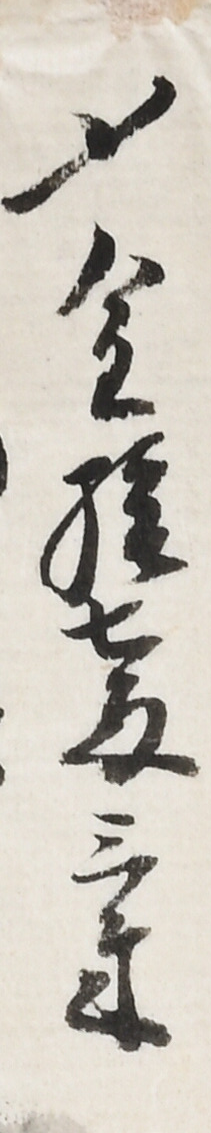〆金拾七両三朱
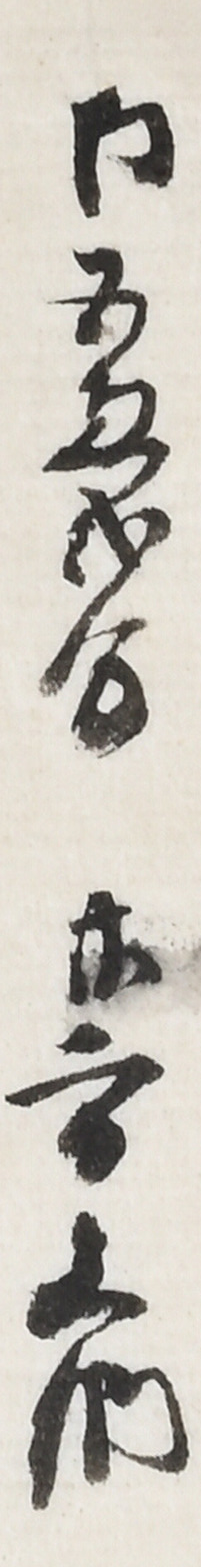内五両弐分廿二日上納
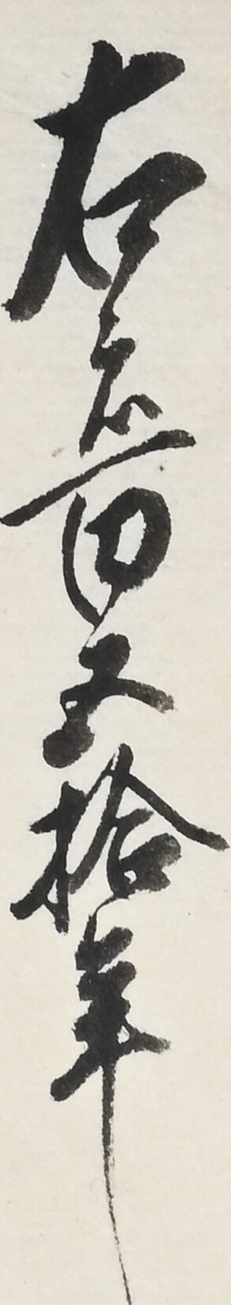右は百五拾年
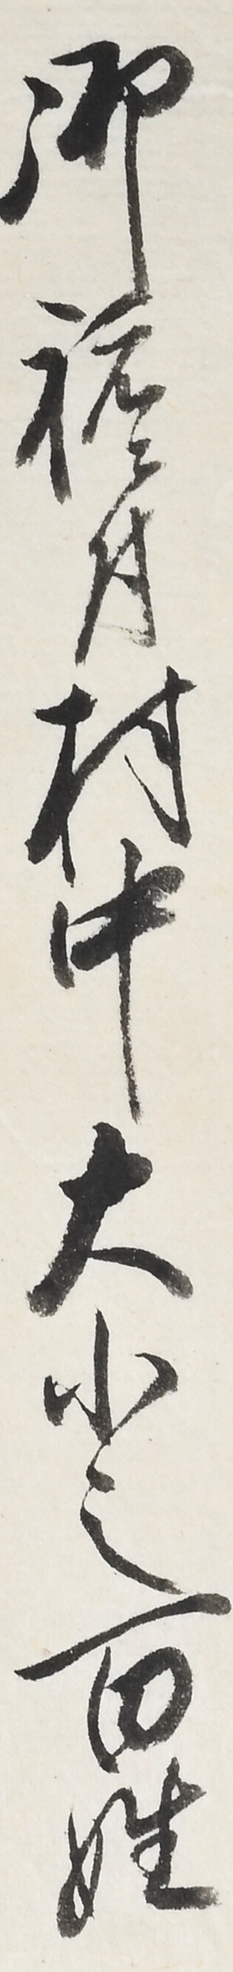御祝ニ付村中大小之百姓
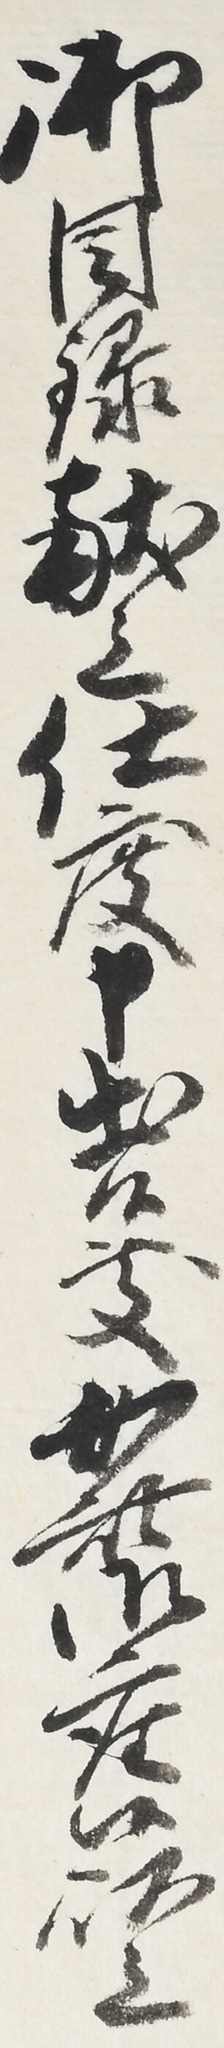御目録献上仕度申出候処如此御座候以上

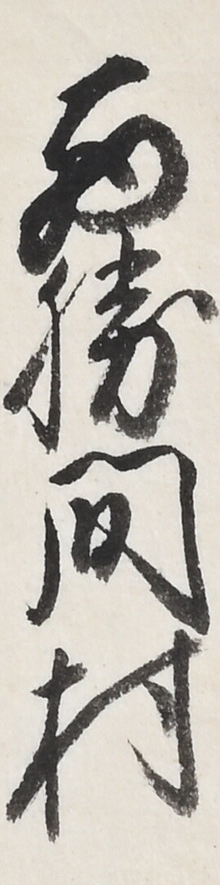西勝間村
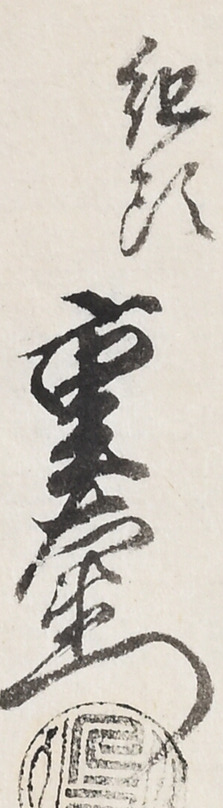組頭重右衛門㊞
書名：御拝地百五拾年御祝儀献上御目録名前
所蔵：伊那市立高遠町図書館・合同会社AMANE
